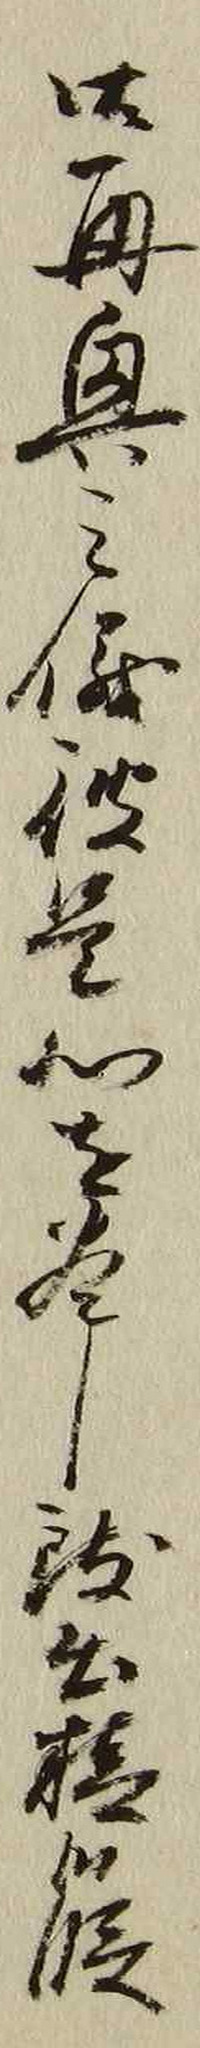御再興之儀彼是心を尽し致出精候段
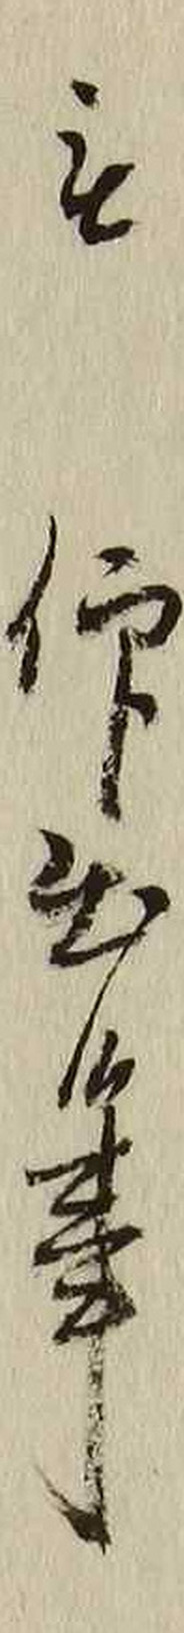被仰出候事
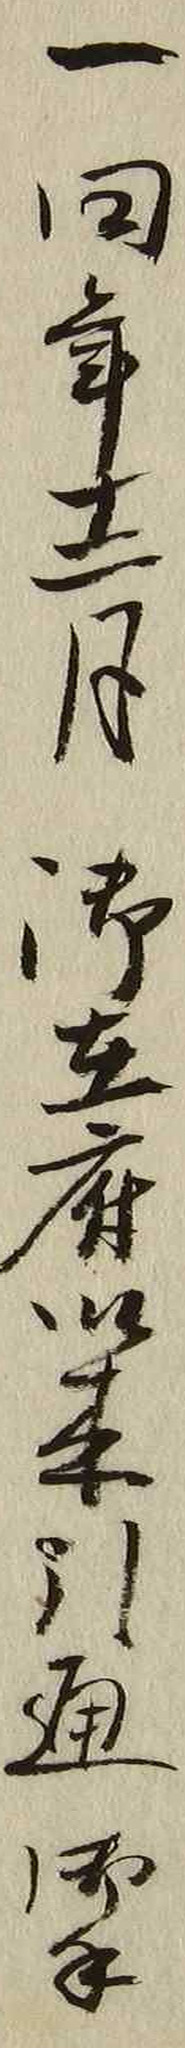一同年十二月御在府以来引通御手
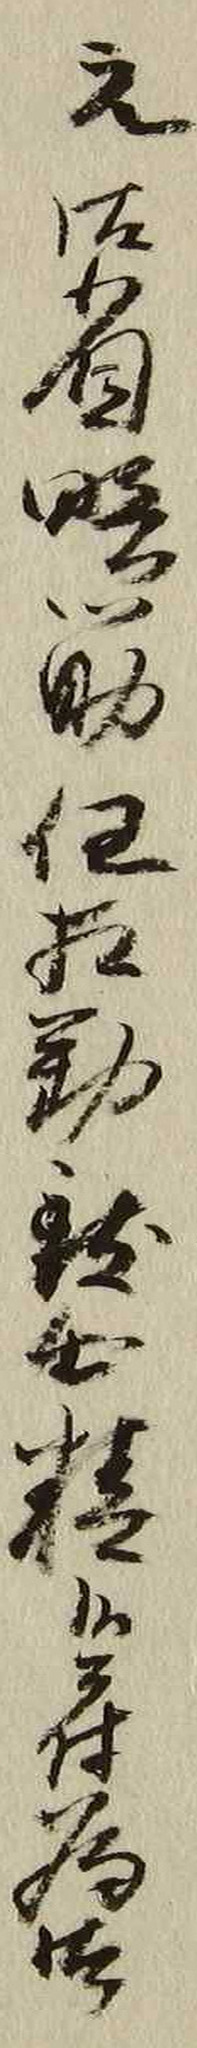元御省略筋任相勤致出精候ニ付為御
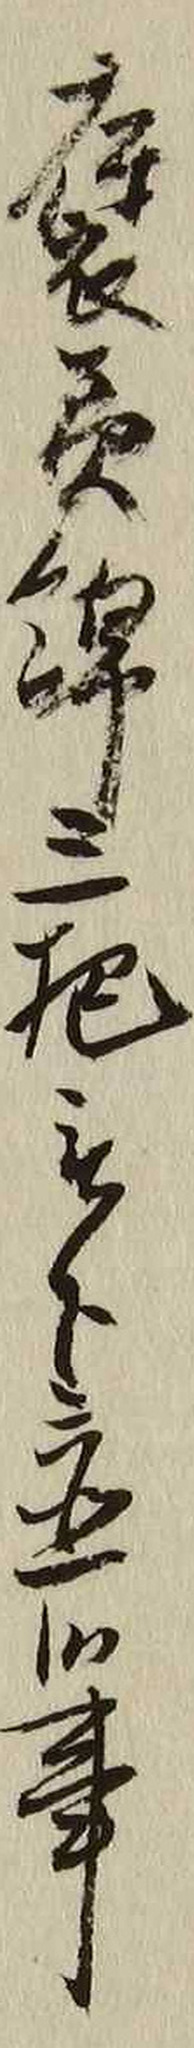褒美綿三把被下置候事
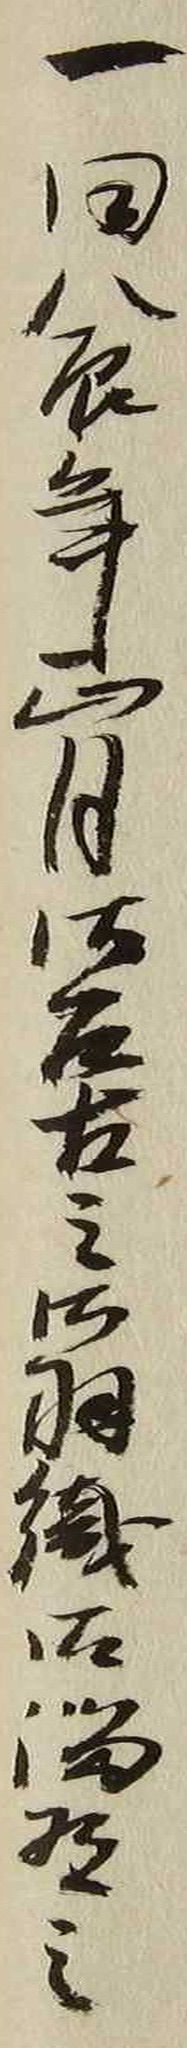一同八年正月御左右之御羽織御溜有之
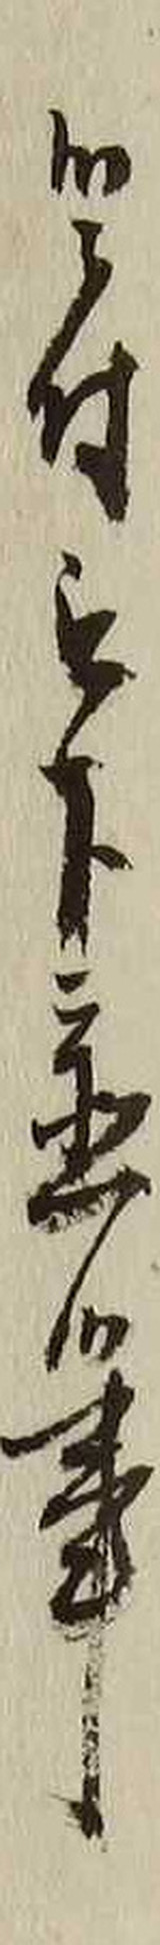候ニ付被下置候事
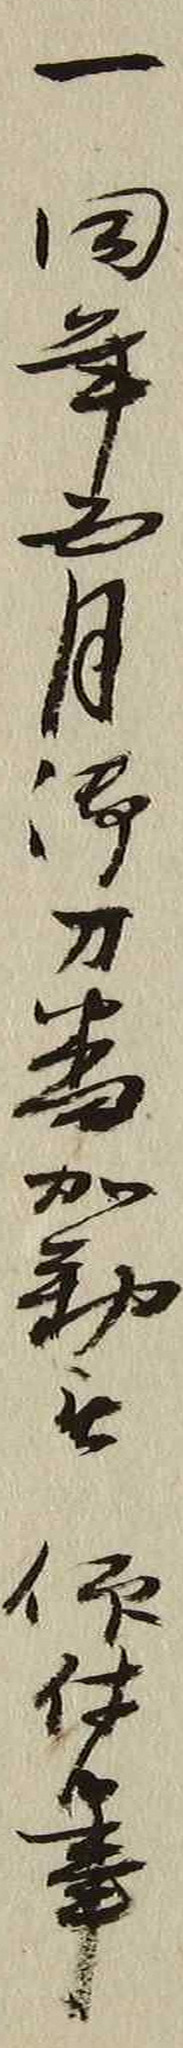一同年五月御刀番加勤被仰付候事
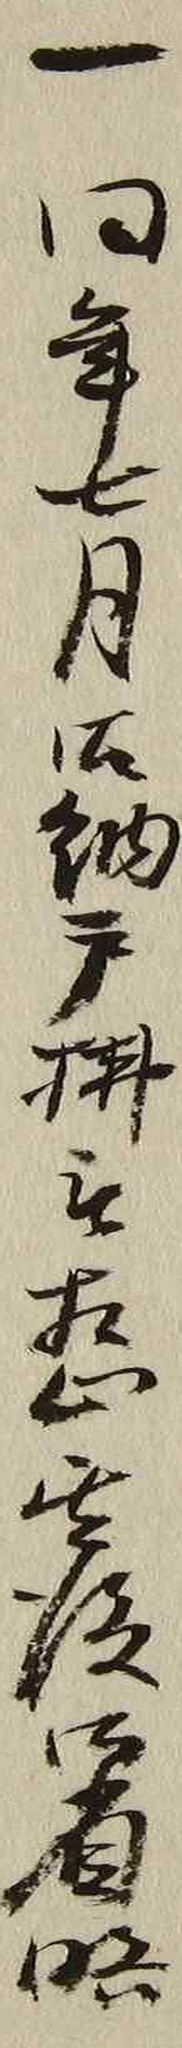一同年七月御納戸払い被相止其後御省略
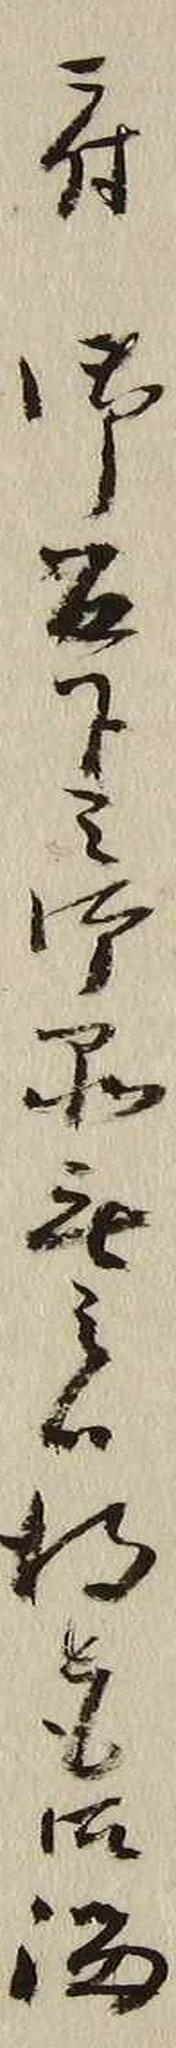ニ付御召下之御品無之候得とも御溜
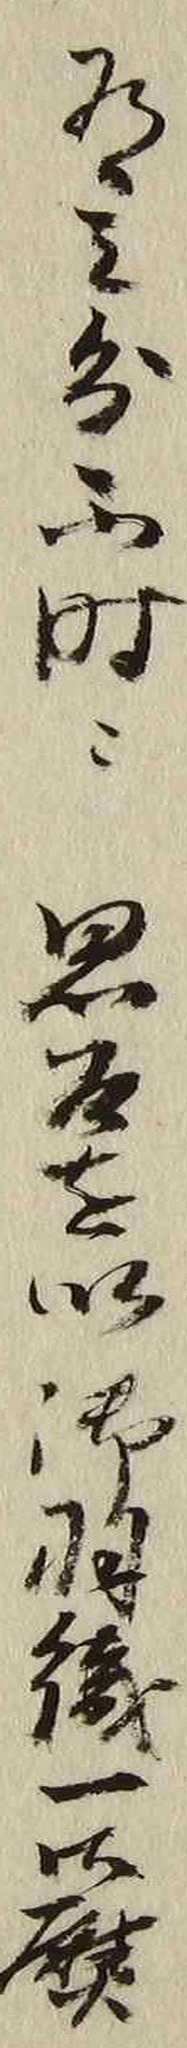有之則不時ニ思召を以御羽織一御熨
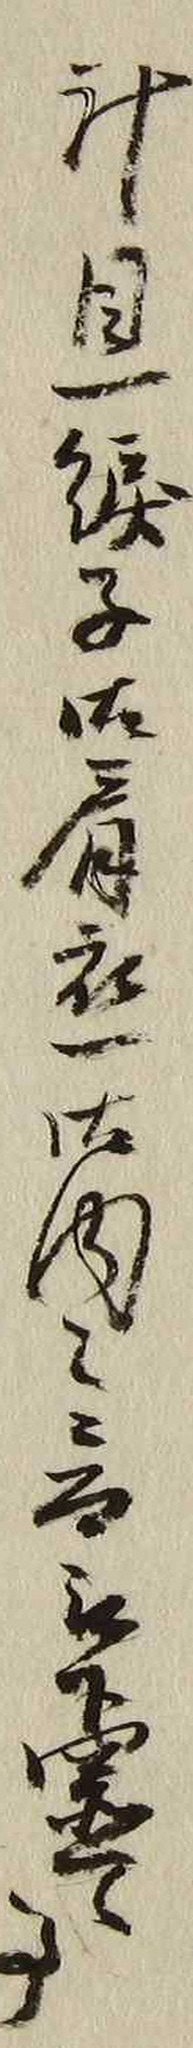斗目一綟子御肩衣一御内々ニ而被下置候事
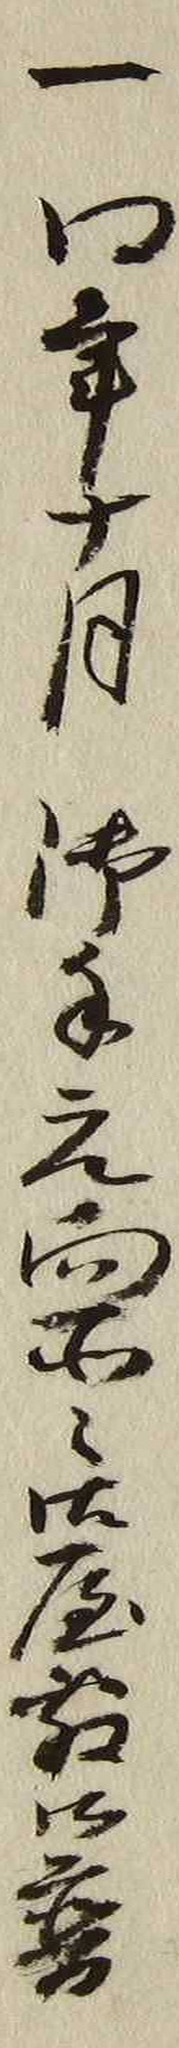一同年十月御手元向所々御屋敷御普
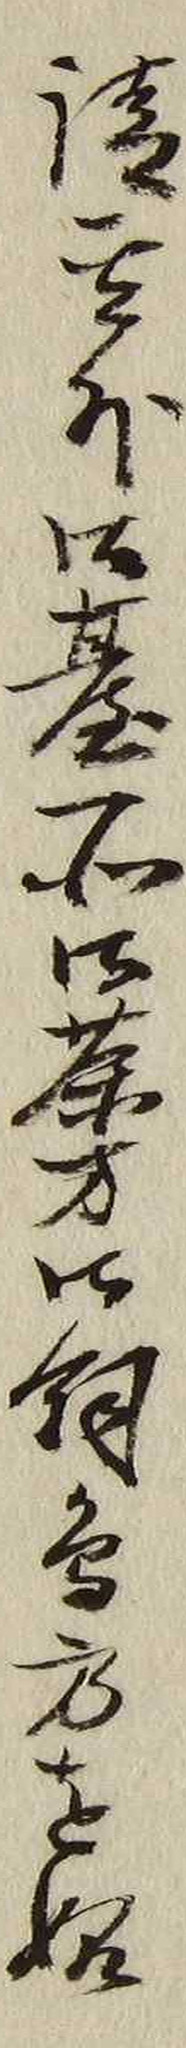請其外御台所御茶方御飼鳥方を始
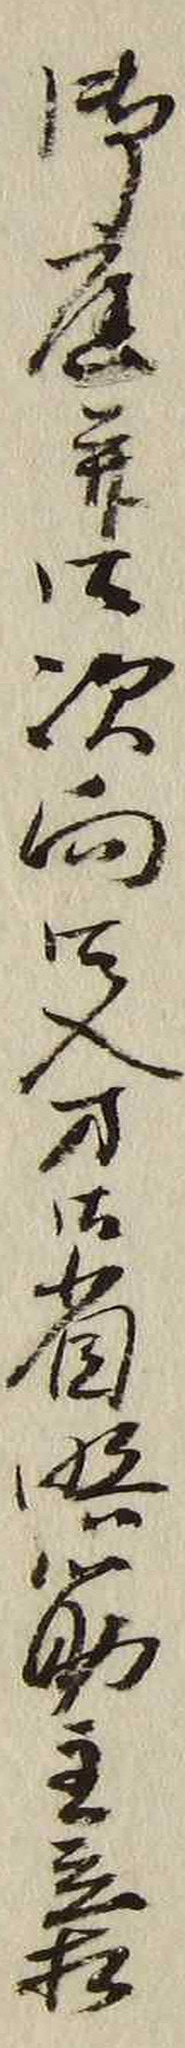御庭并御次向御入方御省略筋主立相
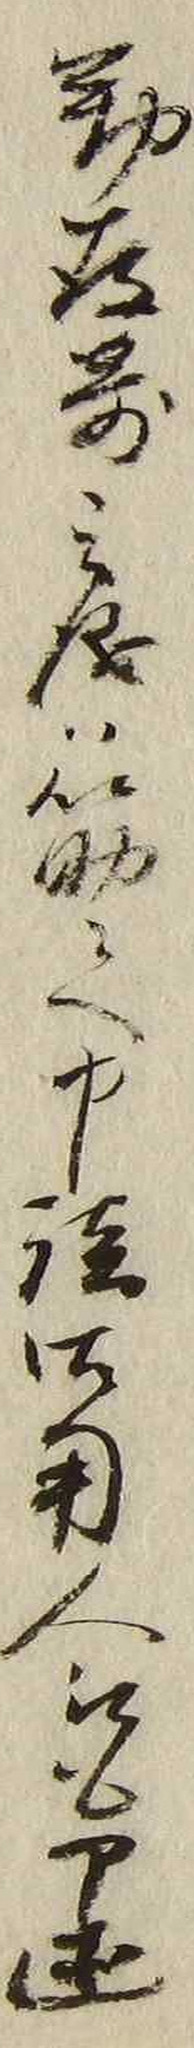勤存寄之儀ハ筋々へ申談御用人江も申述
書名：諸士系譜　巻之345　も之部1
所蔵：会津若松市立会津図書館
